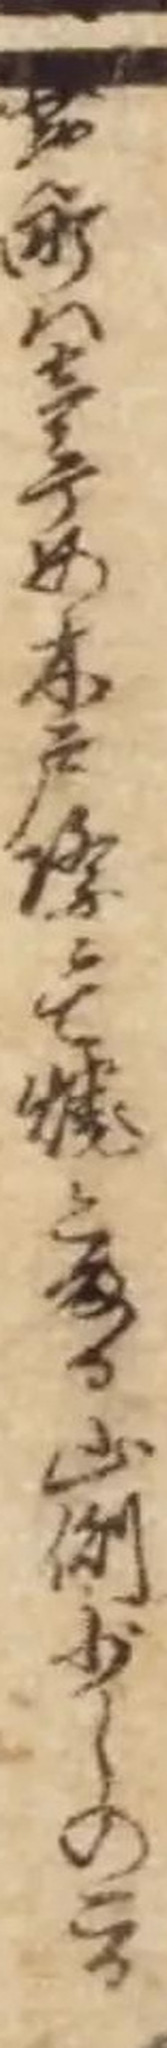茅町は壱丁め木戸際ニて焼とまる山側少しのこる
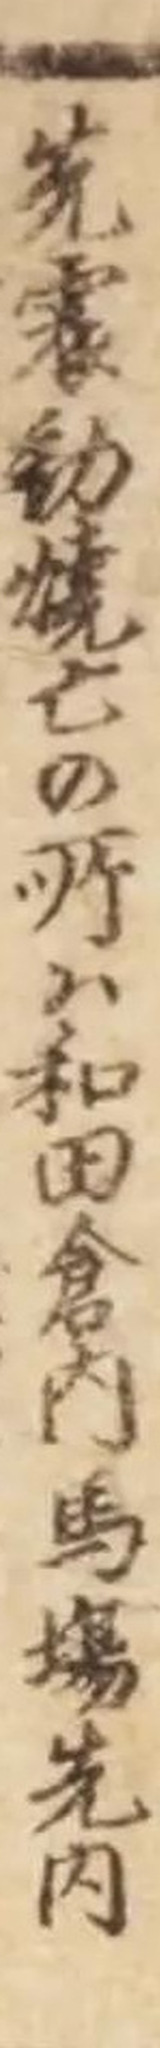先震動焼亡の所は和田倉内馬場先内
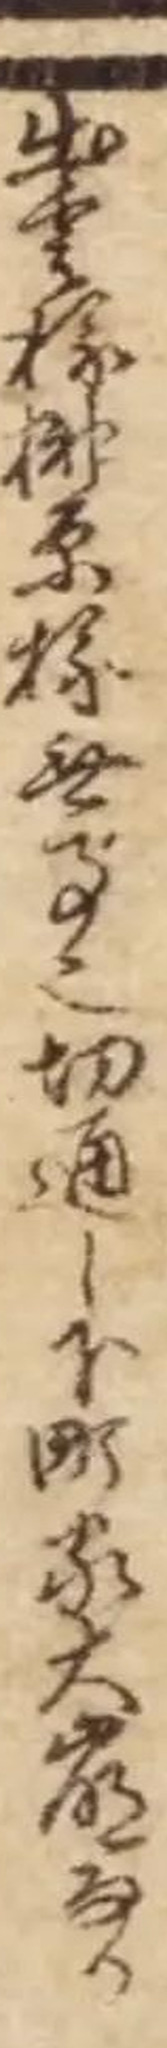出雲様榊原様無事也切通し下町家大崩なり
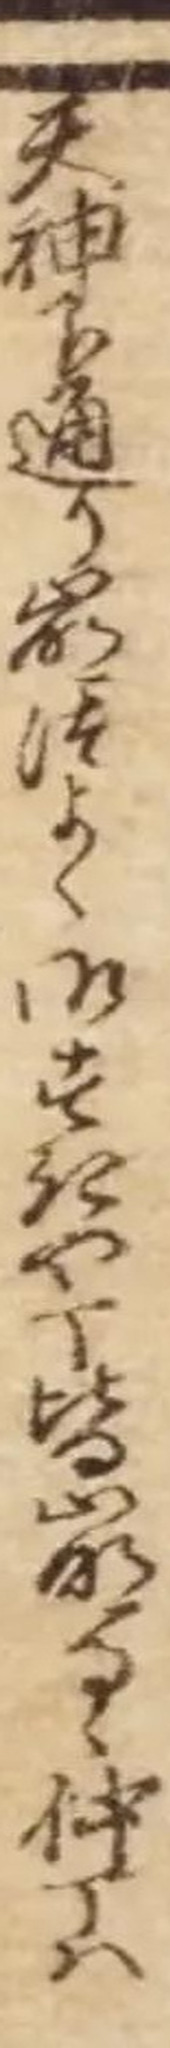天神下通り崩つよく御すきや丁皆崩るゝ仲丁は
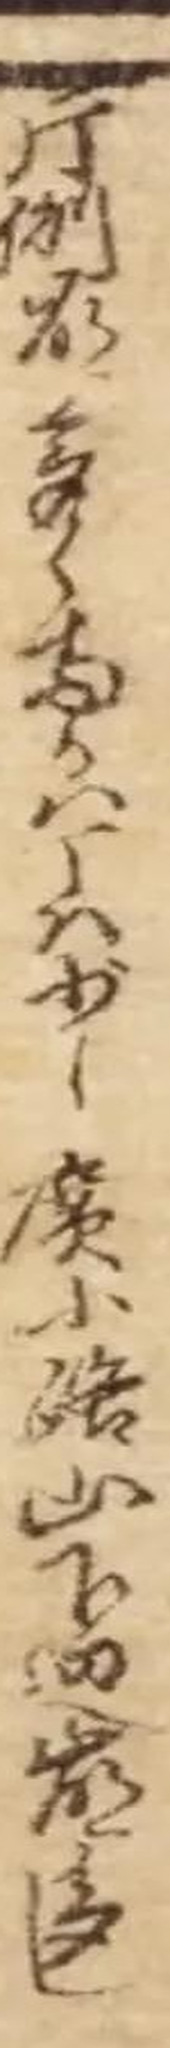片側崩多く両かは丁は少し広小路山下辺崩多し
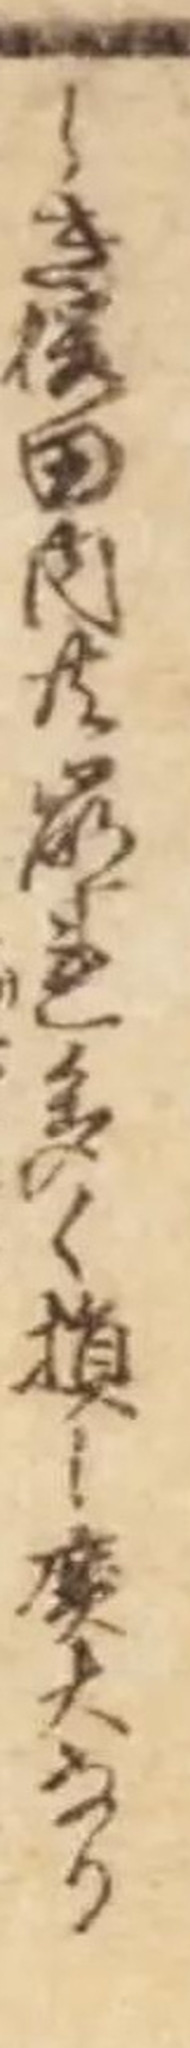しき桜田内共崩れ多く損じ広大なり
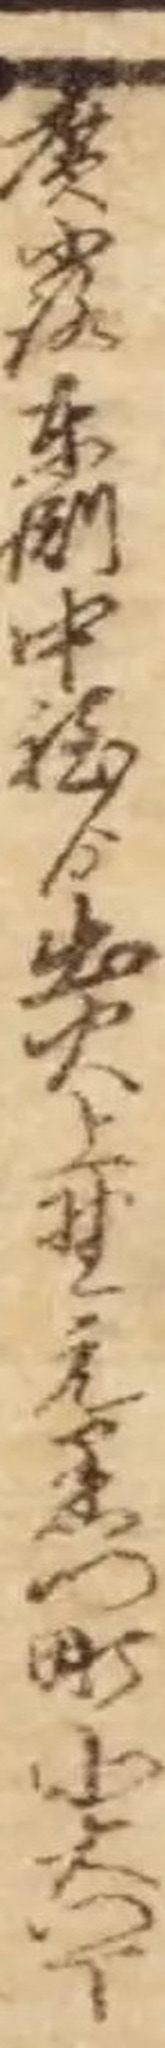廣小路東側中程より出火上野元黒門町北大門丁
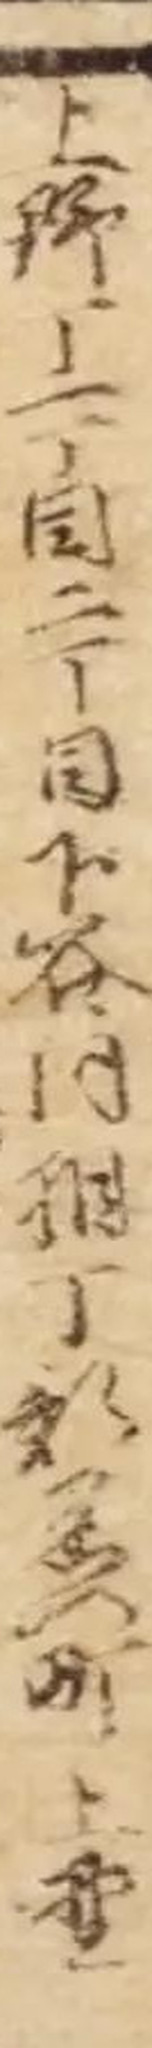上野丁一丁目二丁目下谷同朋丁新黒門町上野
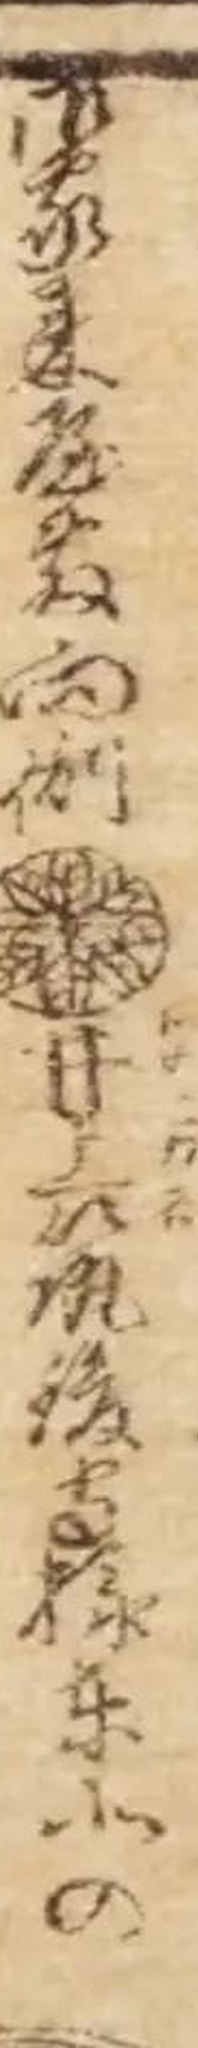御家来屋敷向側〇下総一万石井上筑後守様東北の
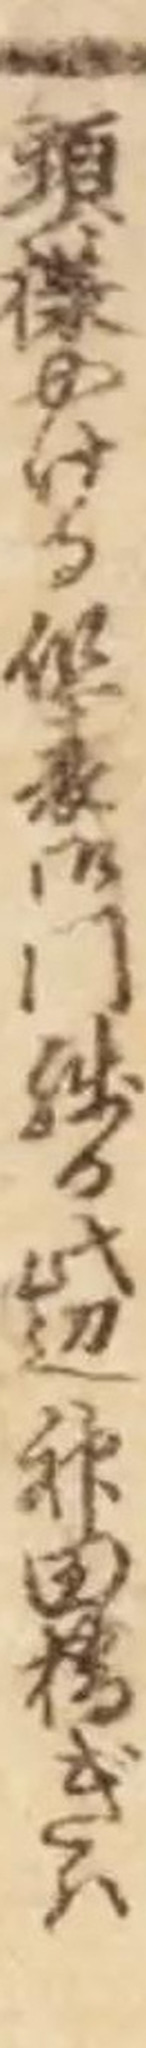頭様やける但表御門残る此辺神田橋ぎは
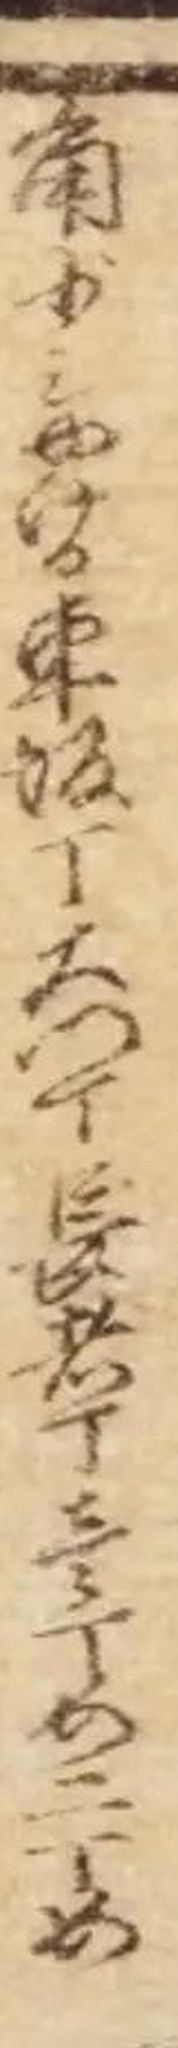角少しやける車坂丁大門丁長者丁壱丁め二丁め
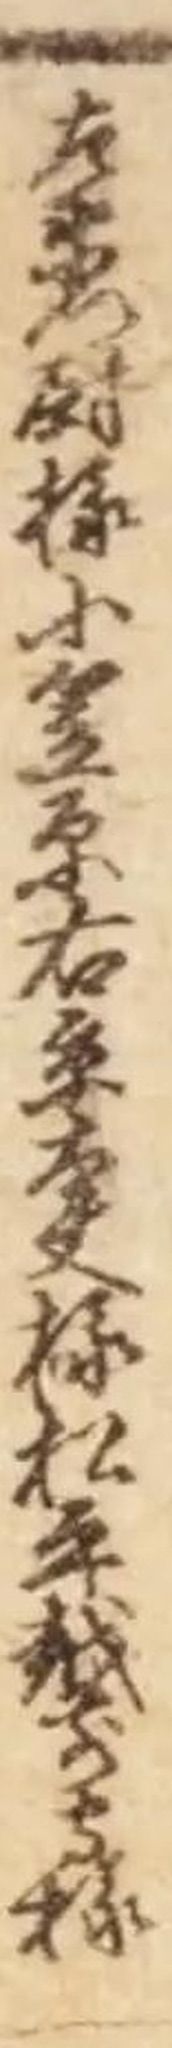左衞門殿様小笠原右京大夫様松平越前守様
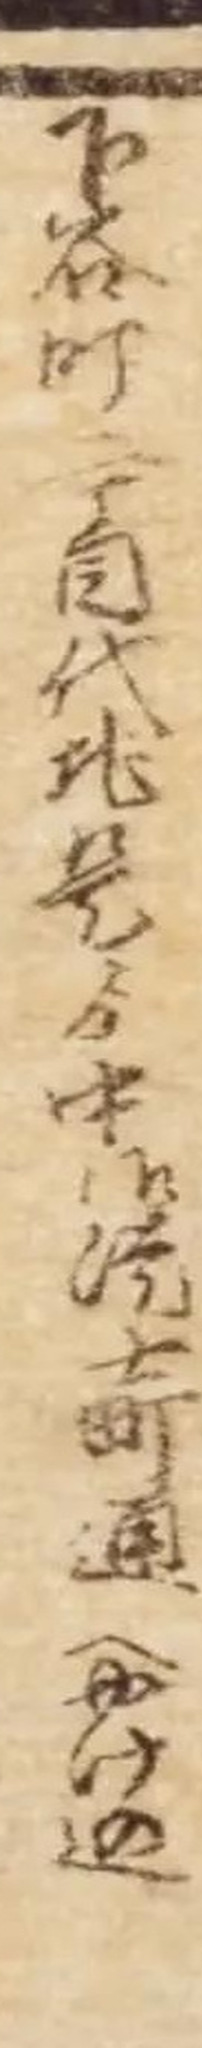下谷町二丁目代地是より中御徒士町通へやけの也
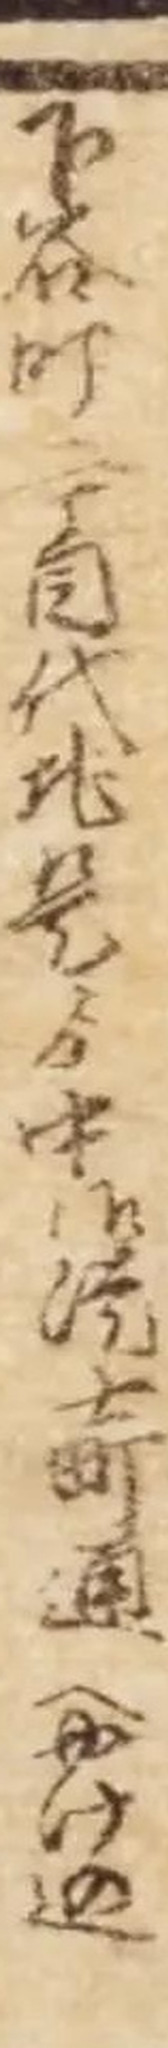下谷町二丁目代地是より中御徒士町通へやけの也
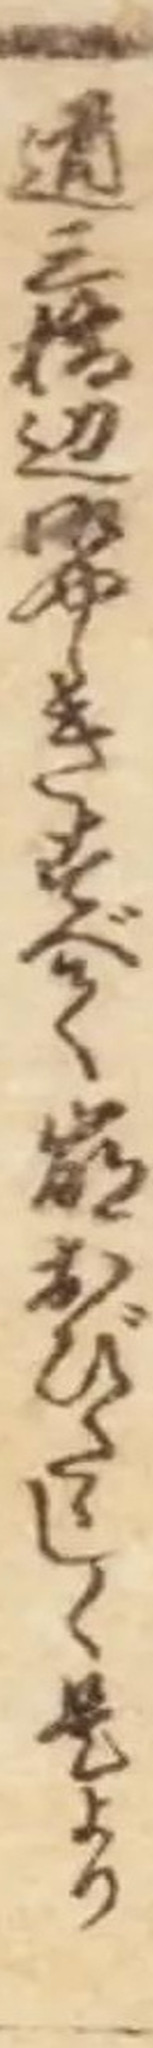道三橋辺御やしきすべて崩おびたゞしく是より
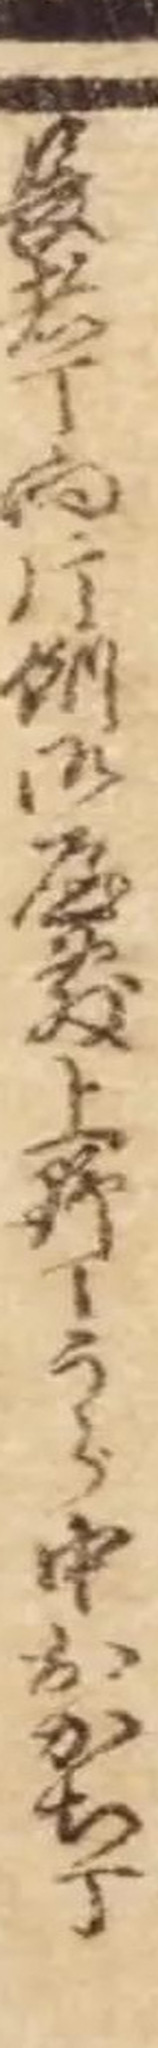長者丁向片側御屋敷上野丁うら中おかち丁
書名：御江戸関八州大地震出火巨細記
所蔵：国立国会図書館 National Diet Library, JAPAN
